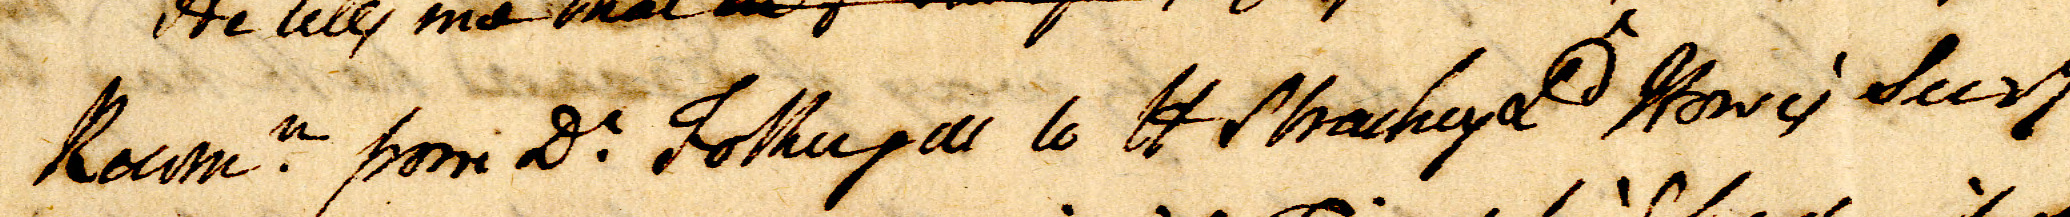Recom^n. from D^r. Fothergell to H Strachey L^d Howes' Secr^y
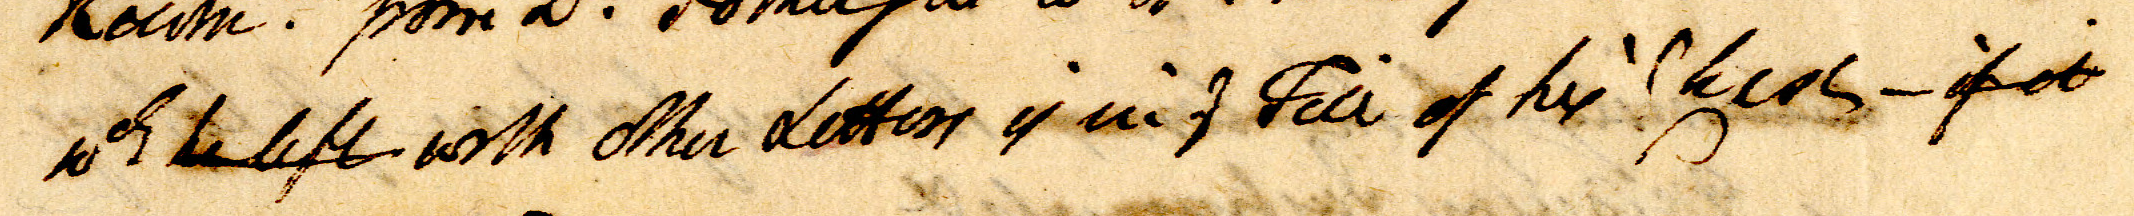w^ch with other Letters is in y^e Till of his Chest- [if it]
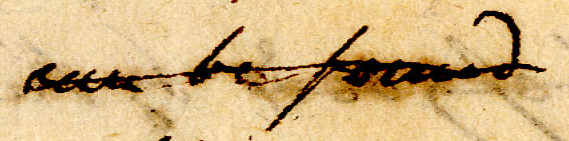[can be found]
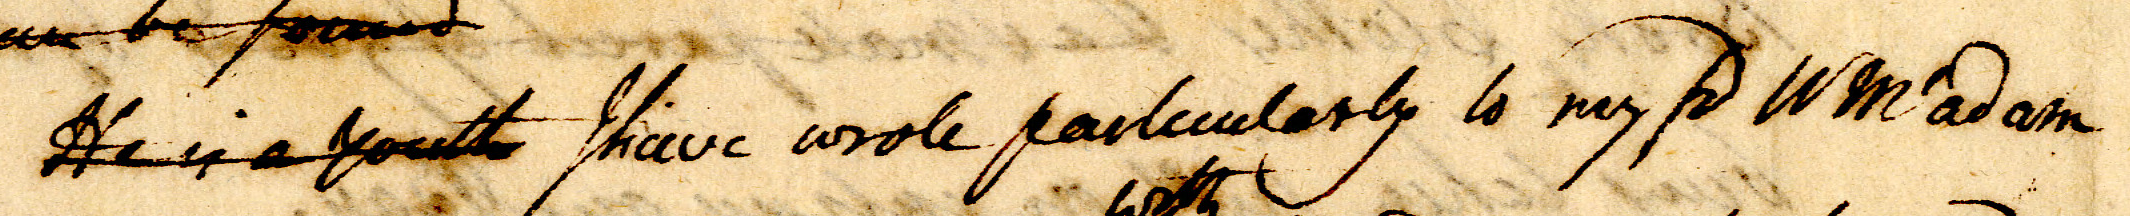I have wrote particularly to my f^d W M^cadam
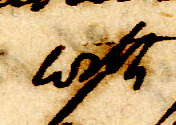with
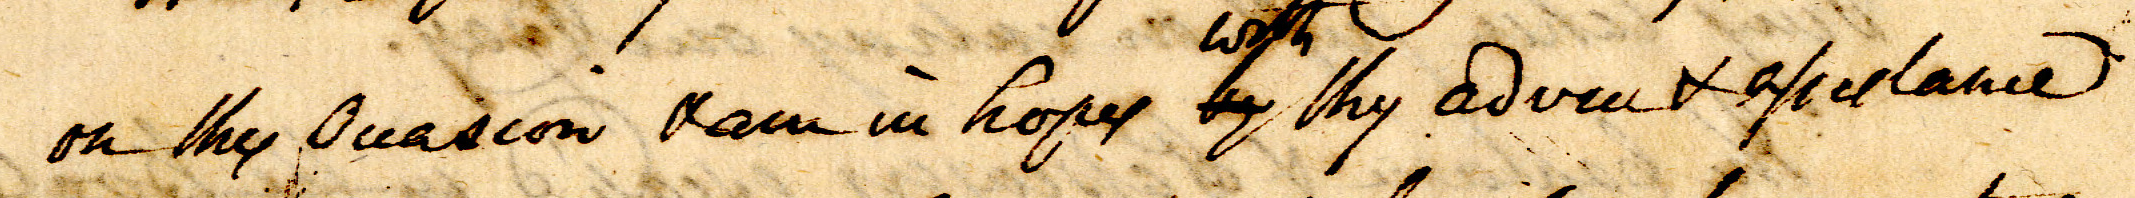on the Occasion & am in hopes [by] thy advice & assistance
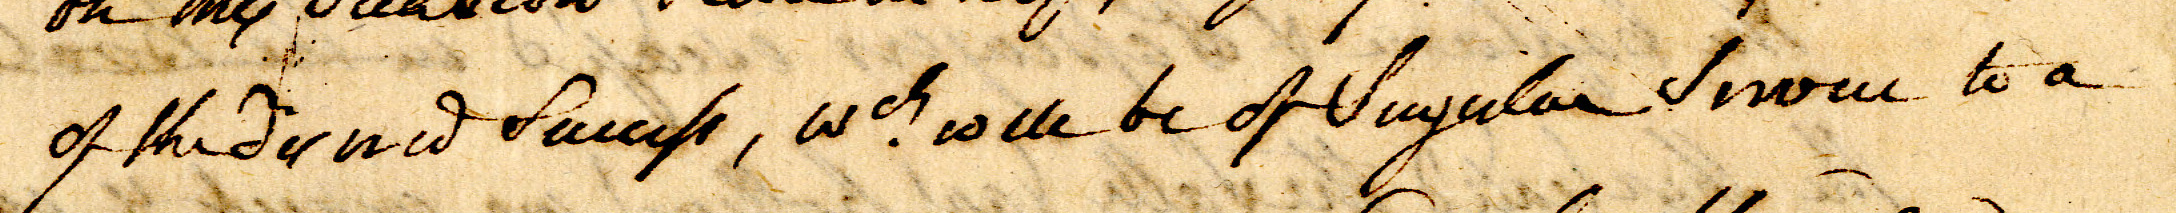of the desired success, w^ch. will be of Singular Service to a
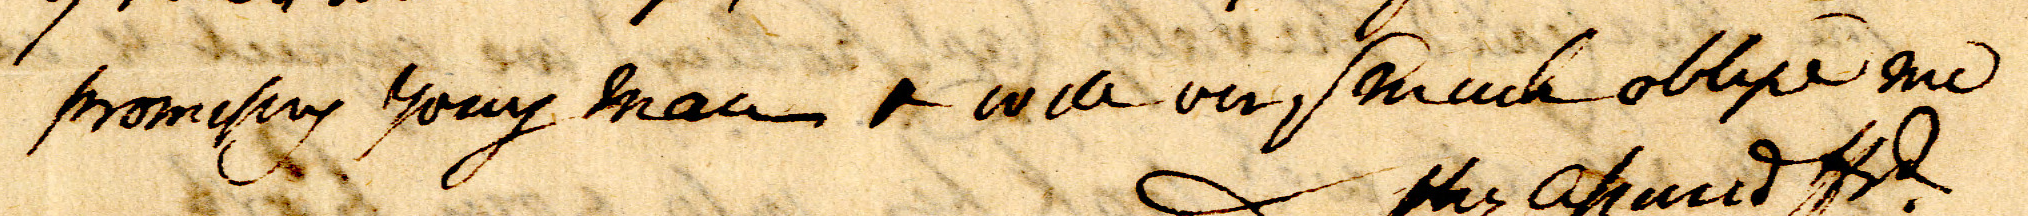promising young man & will very much oblige me
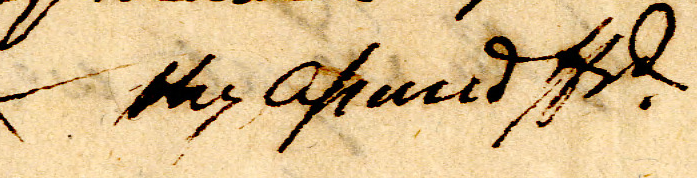thy assured fr^d.
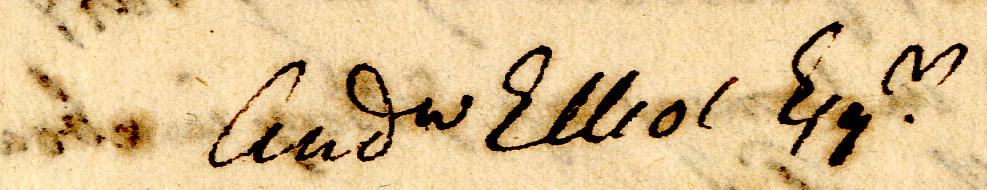And^w Elliot Esq^r.
